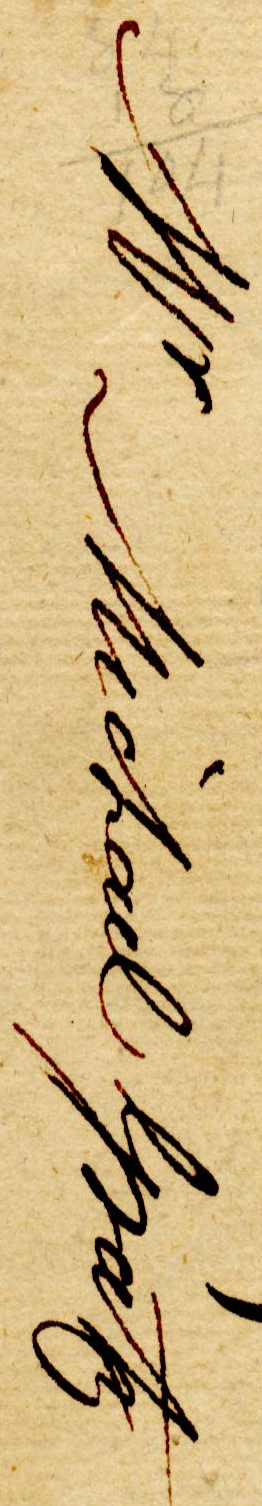M^r Michael Gratz
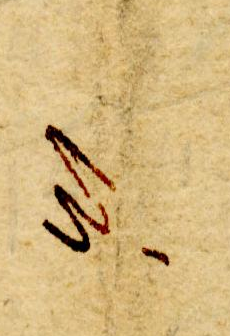in
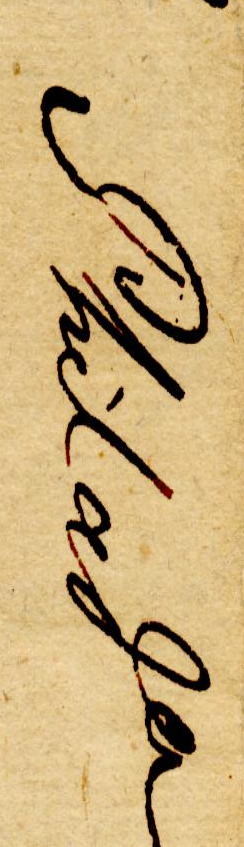Philad^a
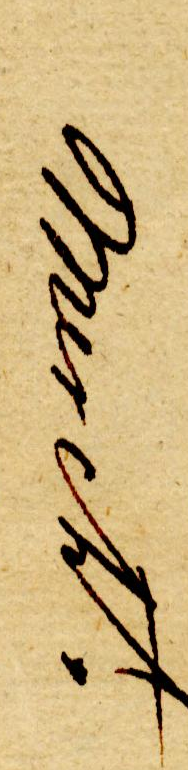Merch^t.
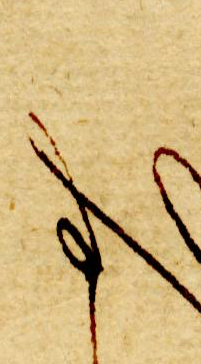To
